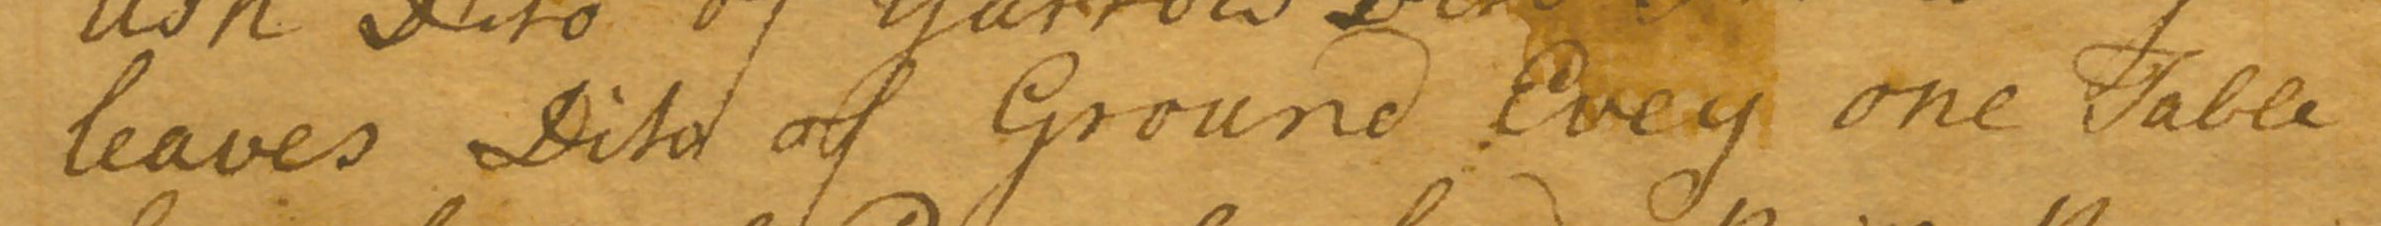leaves Dito of Ground Evey one Table
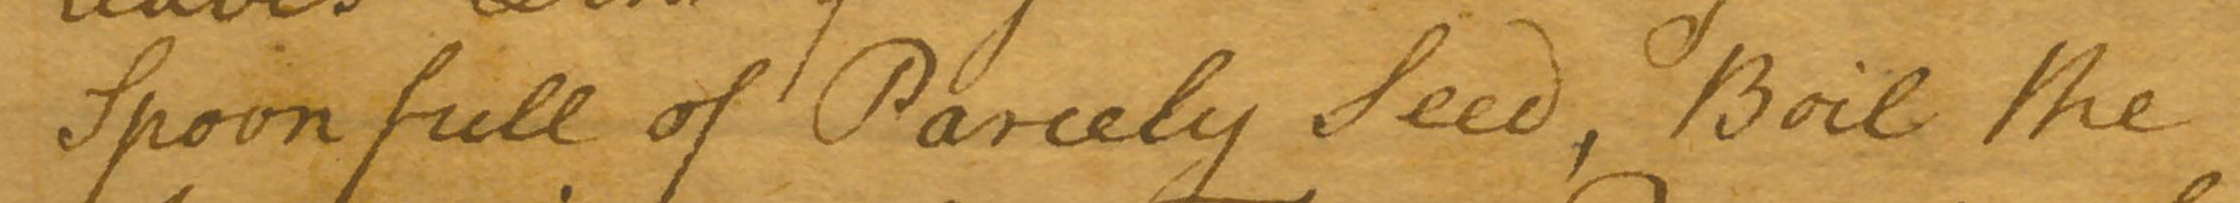spoon full of Parcely seed, Boil the
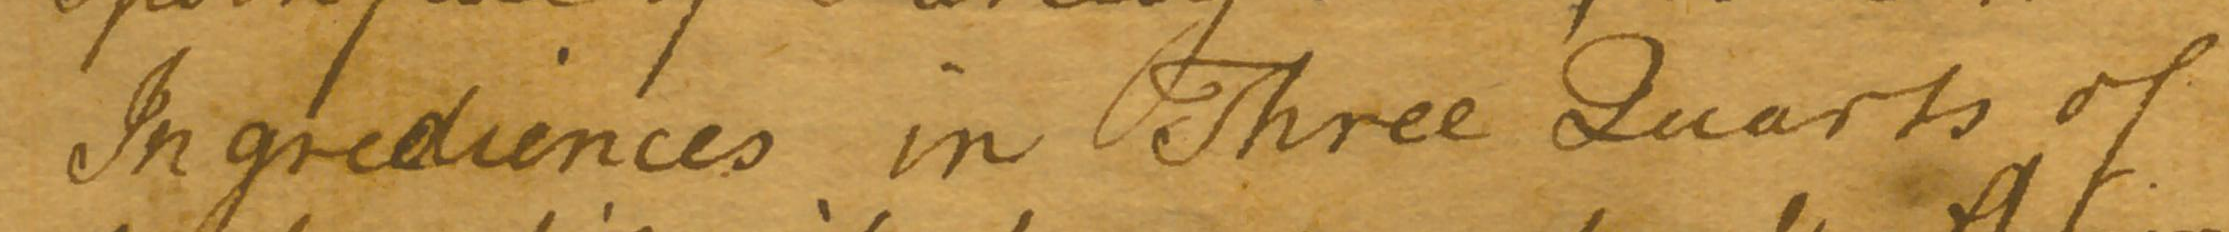Ingrediences in Three Quarts of
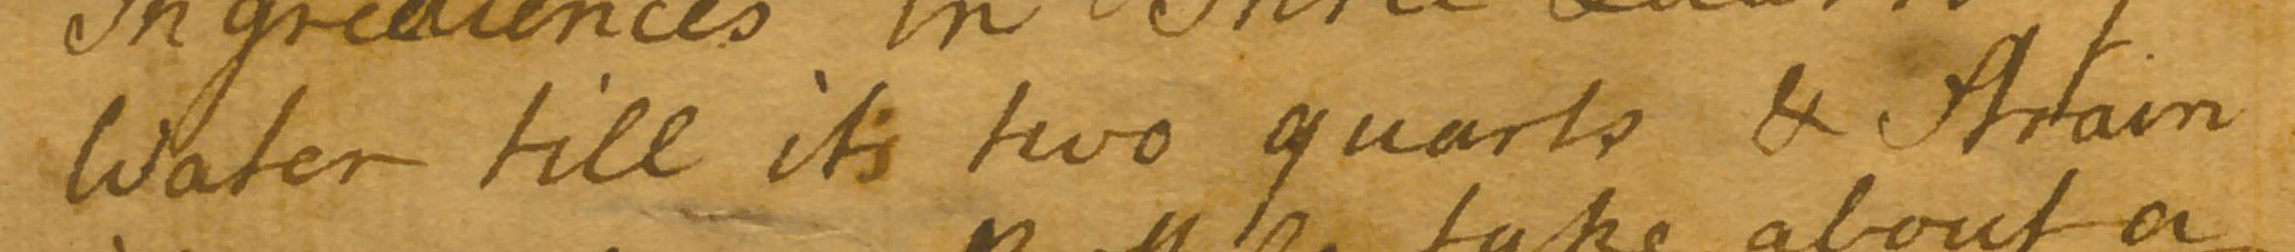Water till its two quarts & strain
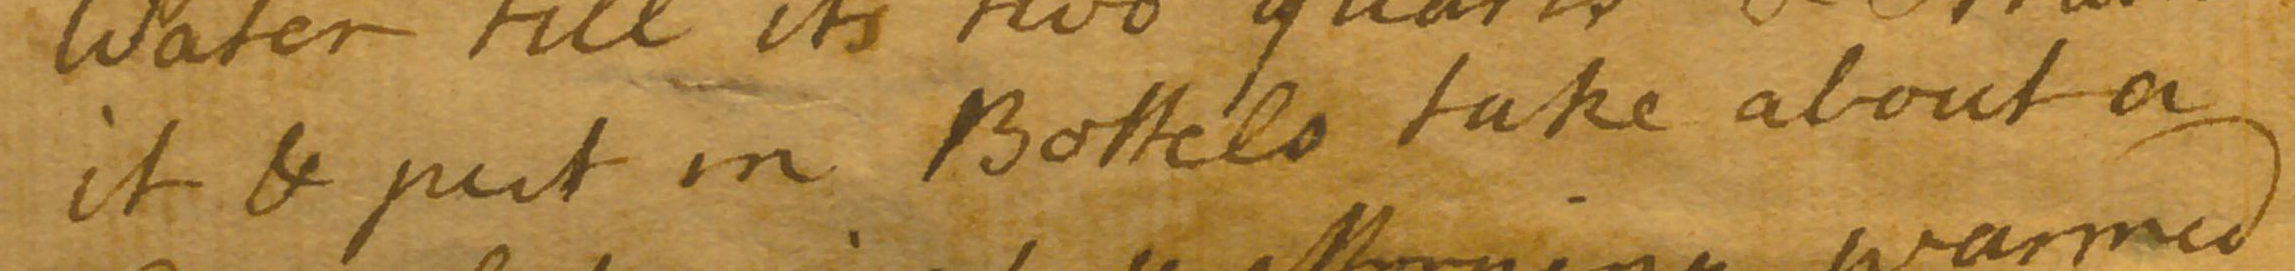it & put in Bottels take about a
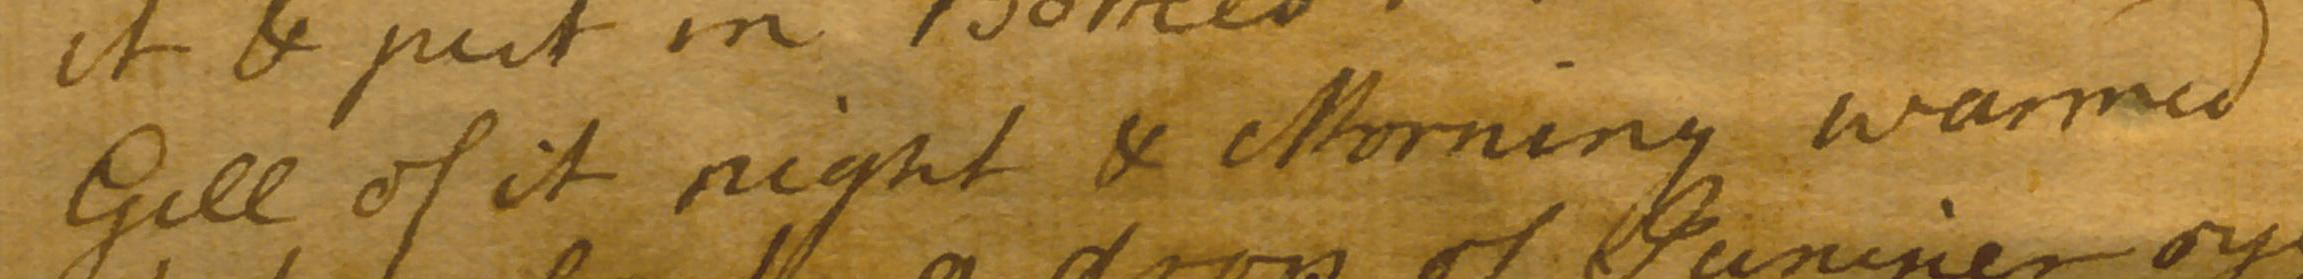Gull of it night & Morning warmed
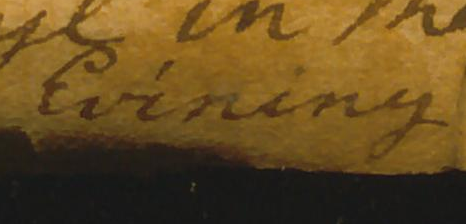Evining
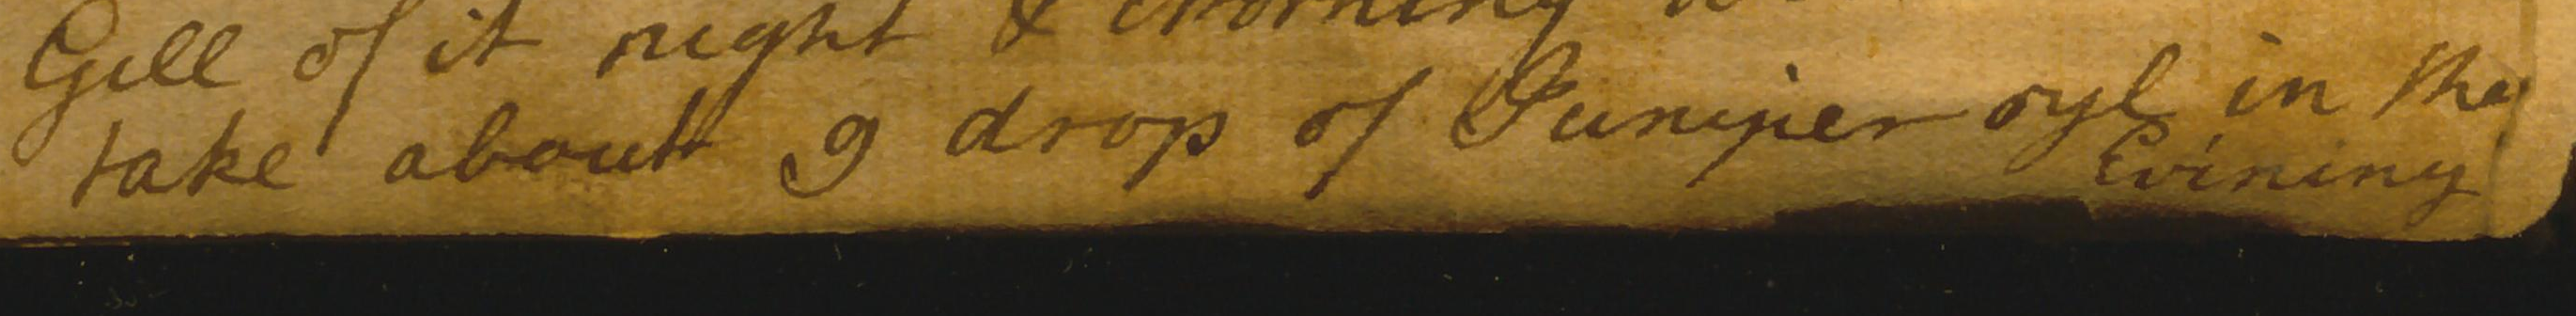take about 9 drops of Juniper oyl in the
